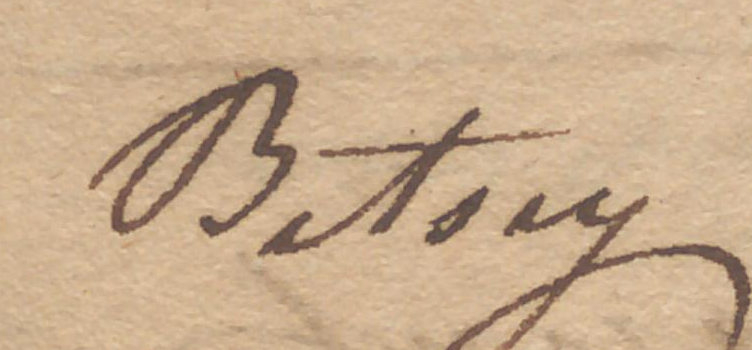Betsey
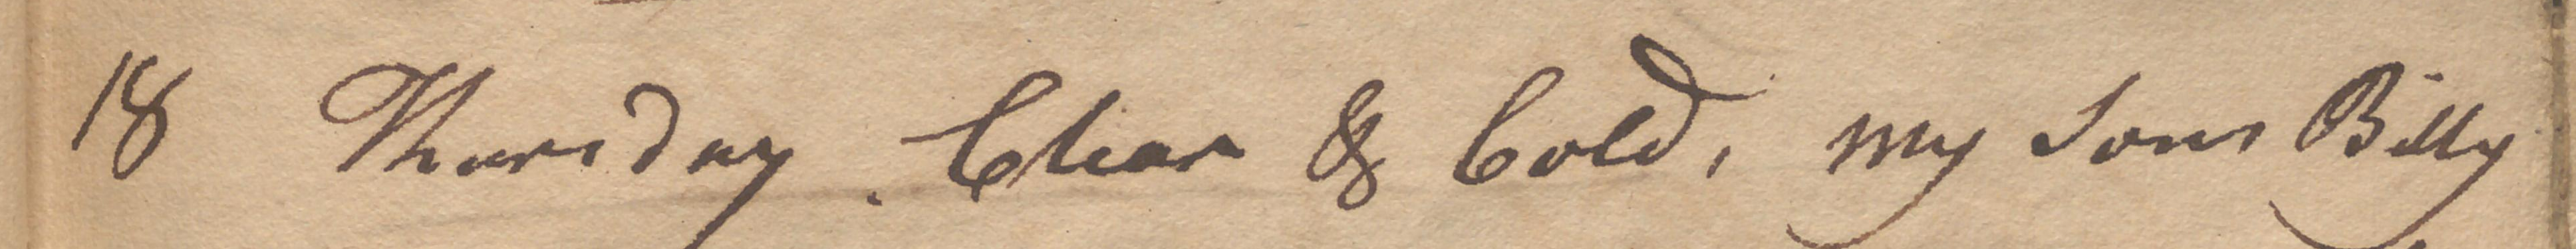18 Thursday Clear & Cold, my sons Billy
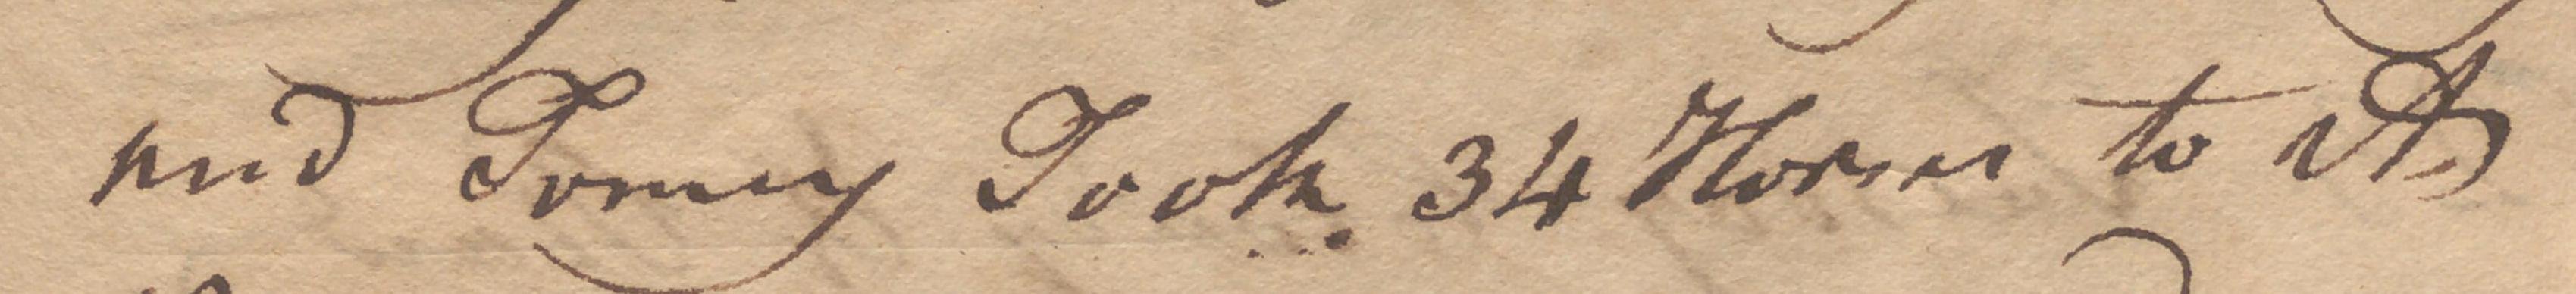and Tomey Took 34 Horses to A
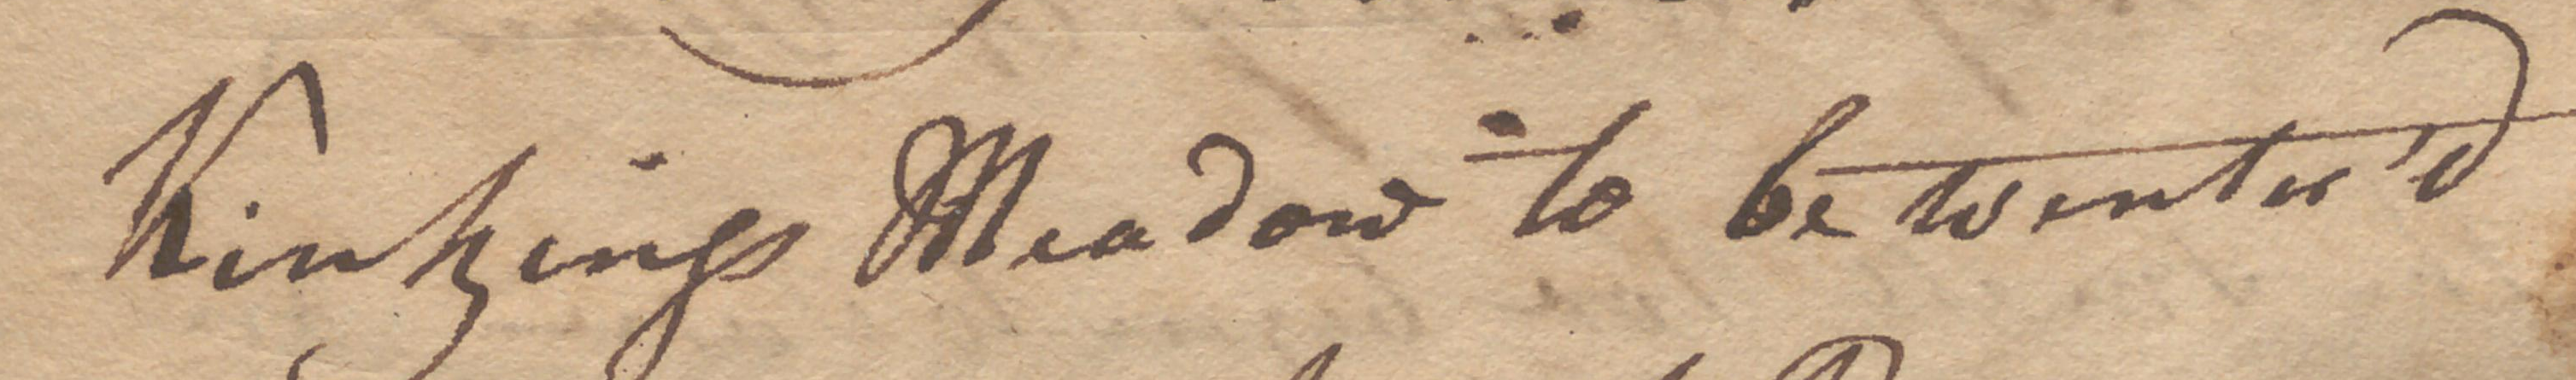Kintzings Meadow to be winter'd
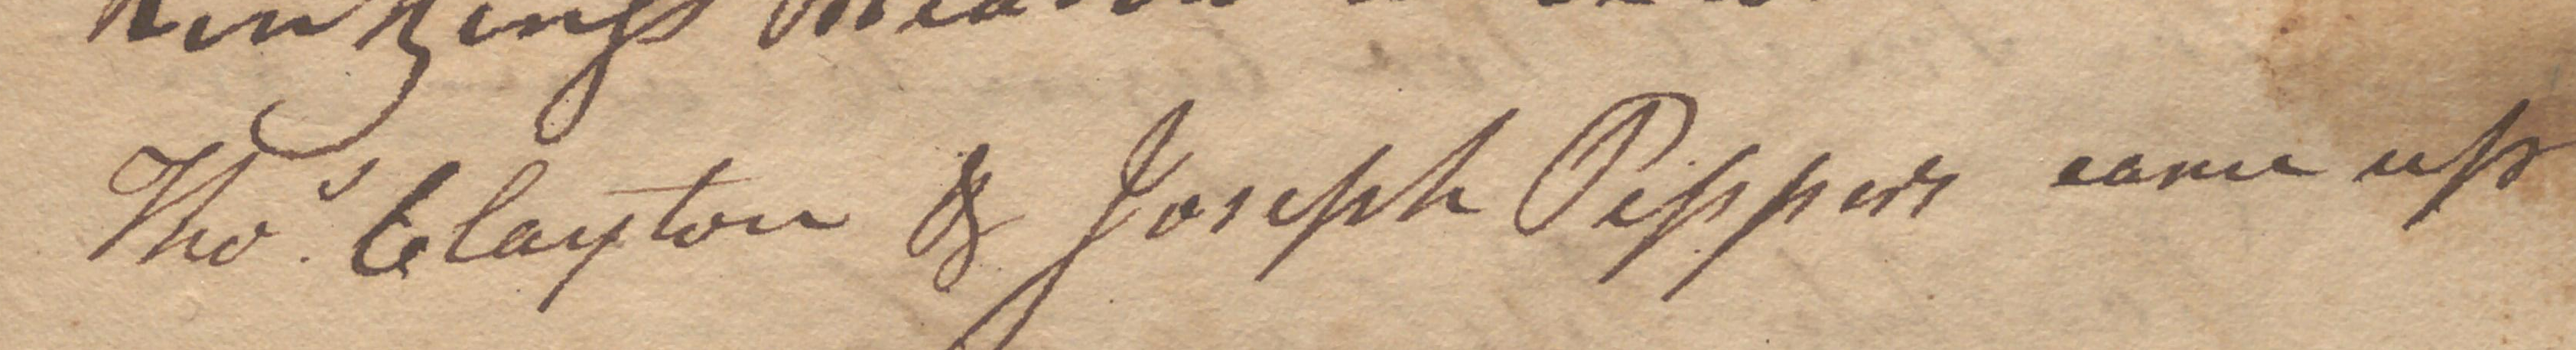Tho^s. Clayton & Joseph Peppers came up
